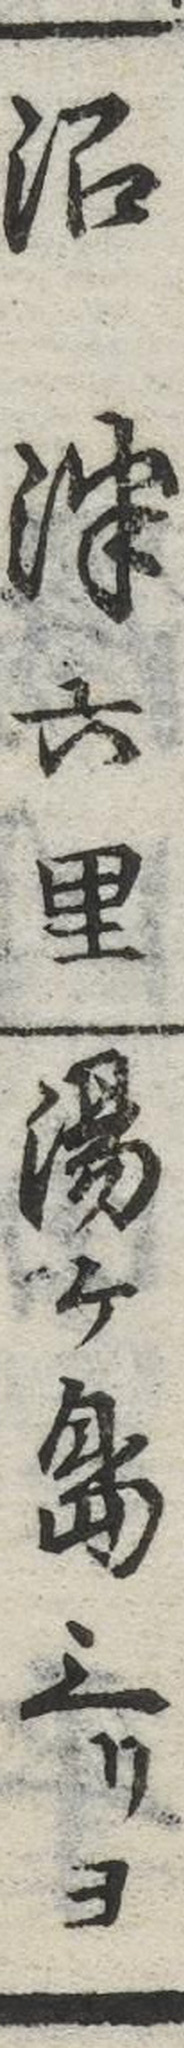沼津六里湯ヶ島三リヨ
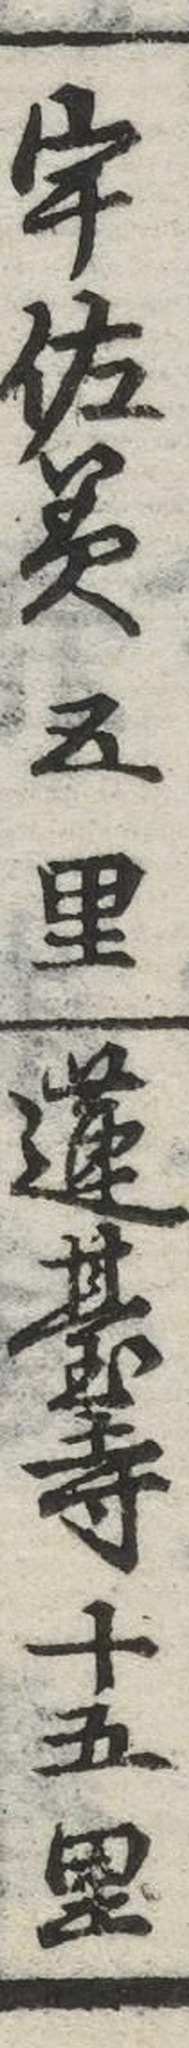宇佐美五里蓮台寺十五里
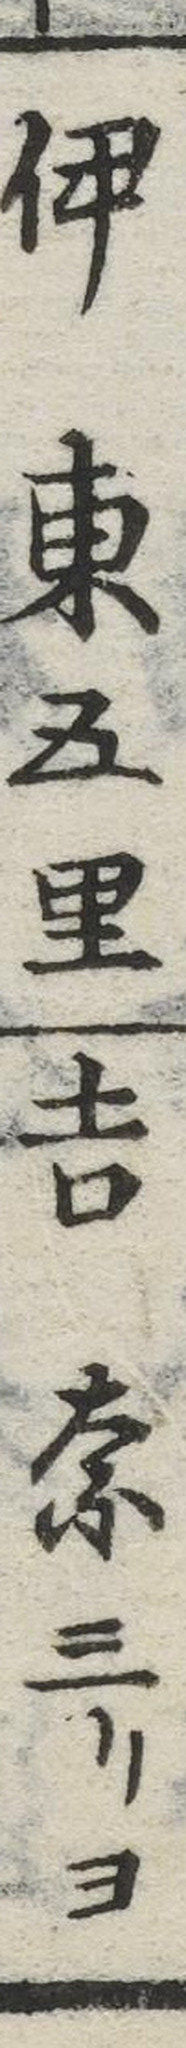伊東五里吉奈三リヨ
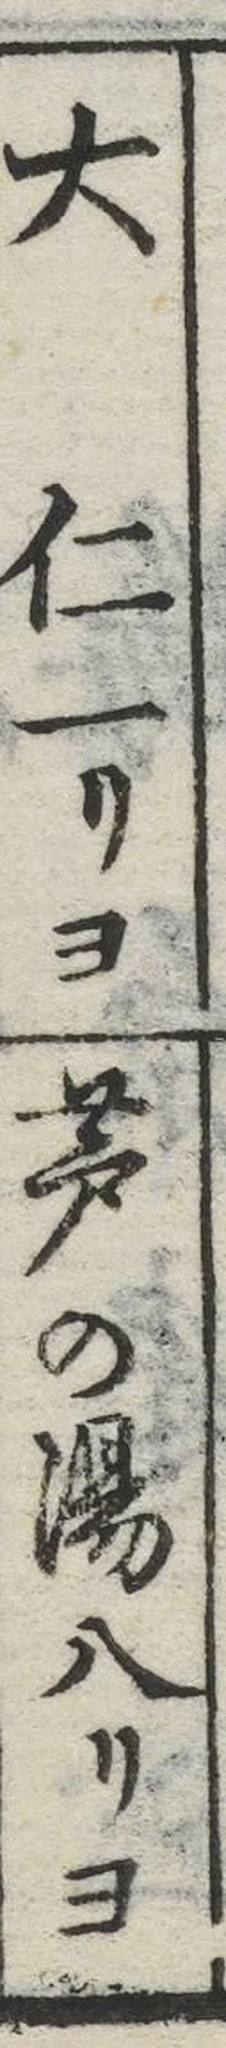大仁一リヨ芦の湯八リヨ
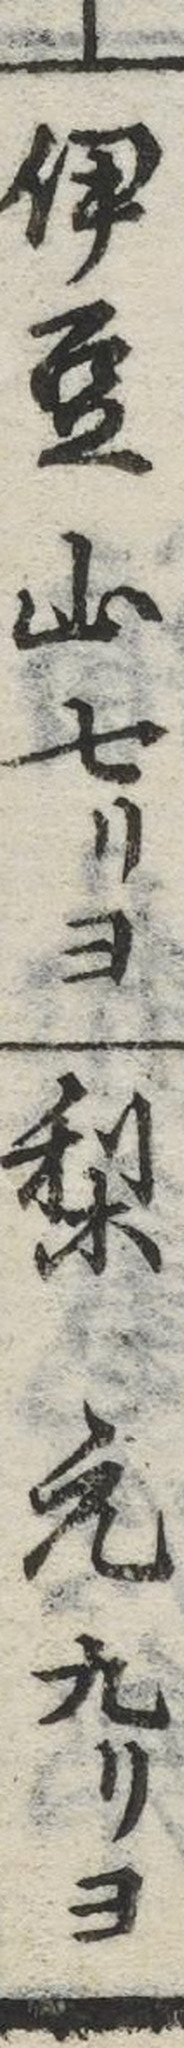伊豆山七リヨ梨元九リヨ
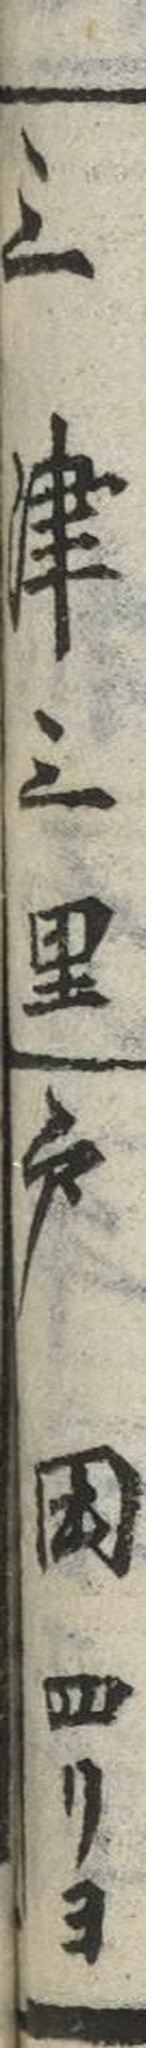三津三里戸田四リヨ
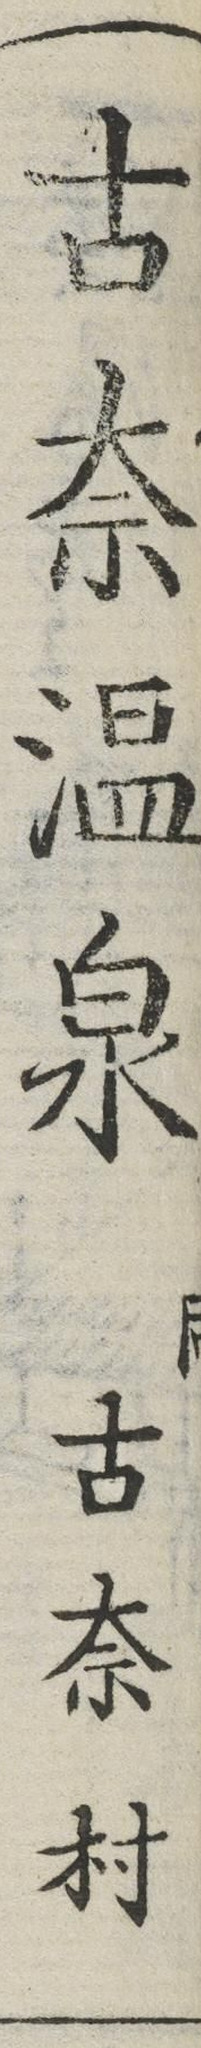古奈温泉同古奈村
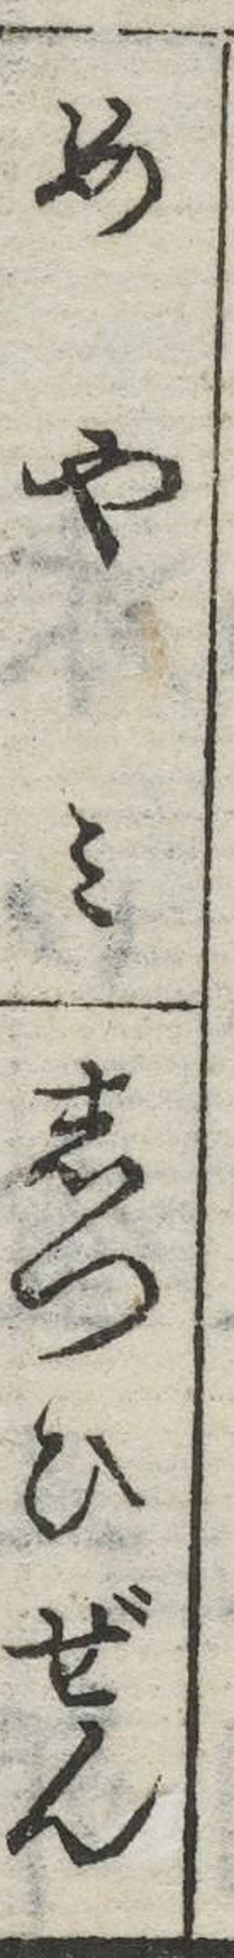めやみしつひぜん
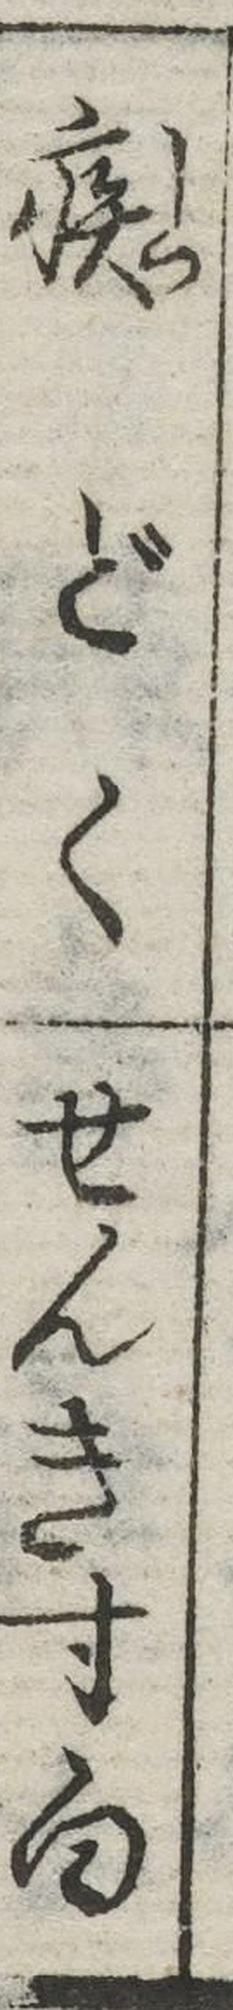疾どくせんき寸白
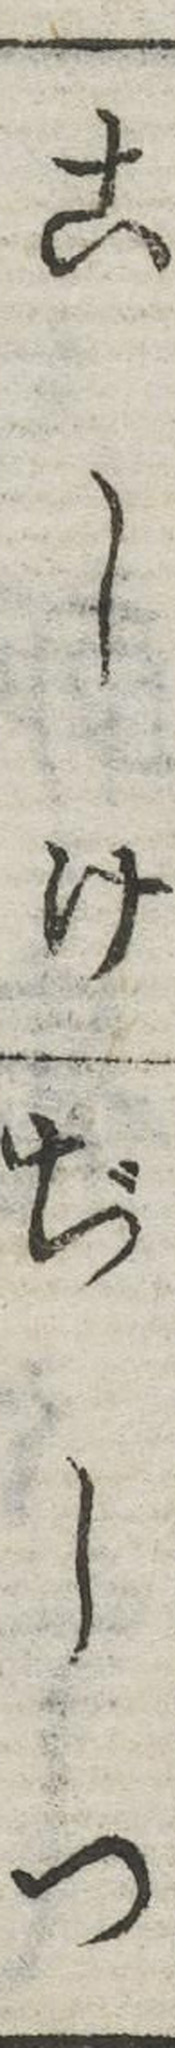こしけぢしつ
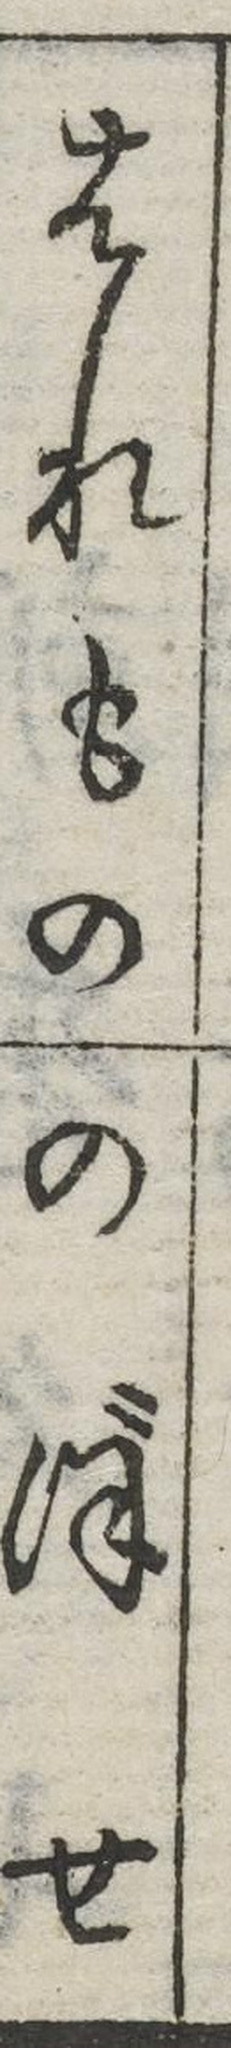はれもののぼせ
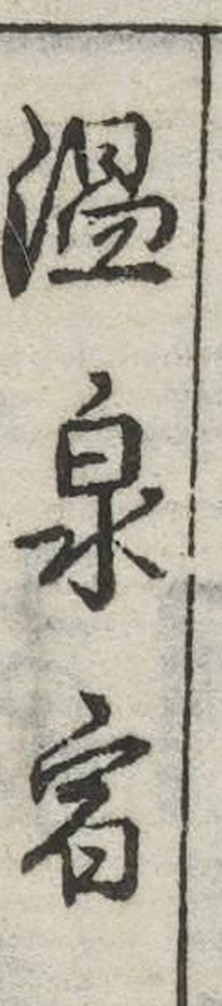温泉宿
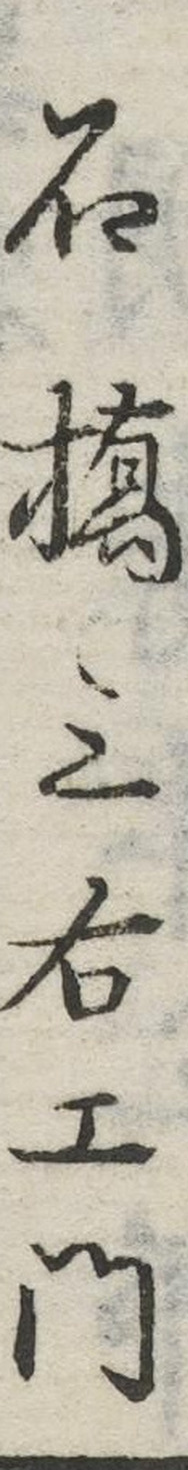石橋三右衛門
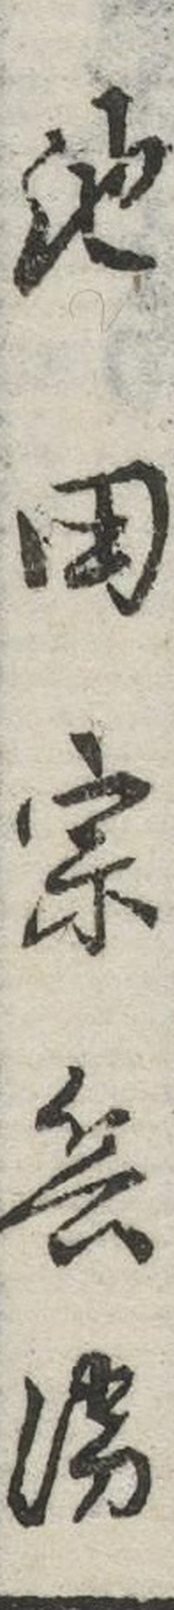池田宗兵衛
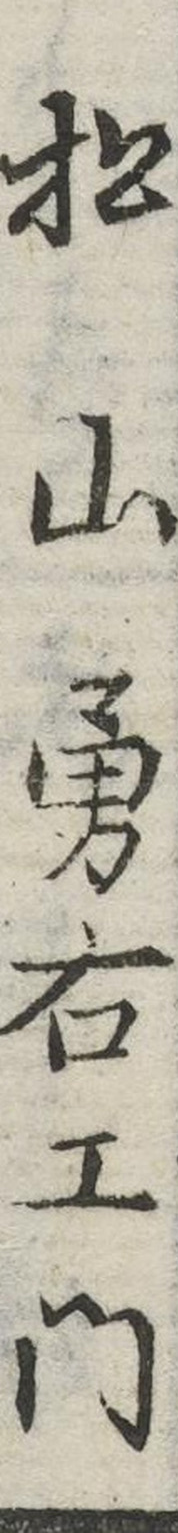松山勇右衛門
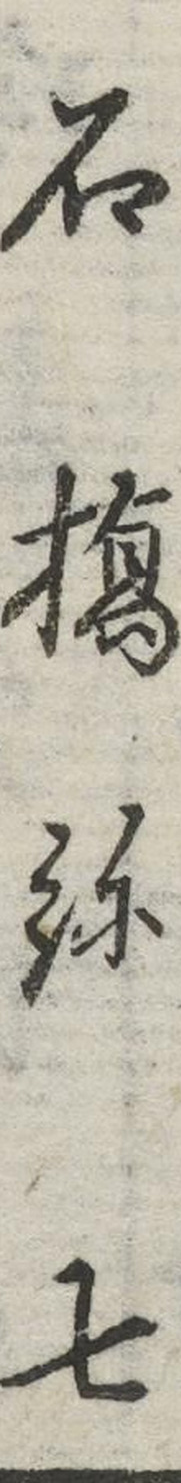石橋弥七
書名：諸國温泉遊覽記　全
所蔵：東京大学地震研究所図書室 Earthquake Research Institute Library, The University of Tokyo, JAPAN
